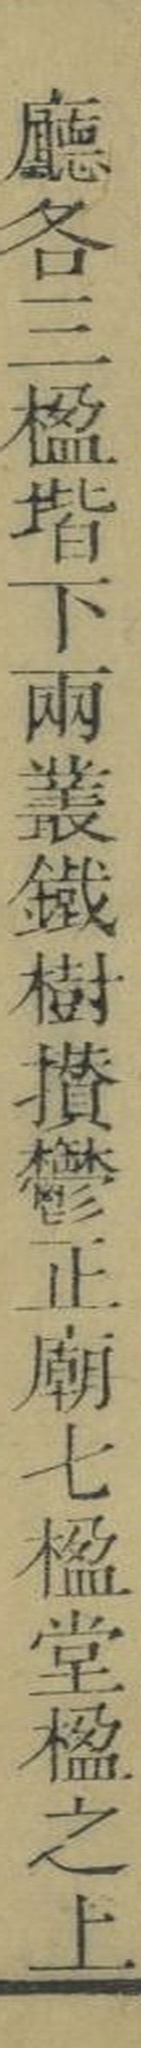廳各三楹堦下兩叢鐵樹攅鬱正廟七楹堂楹之上
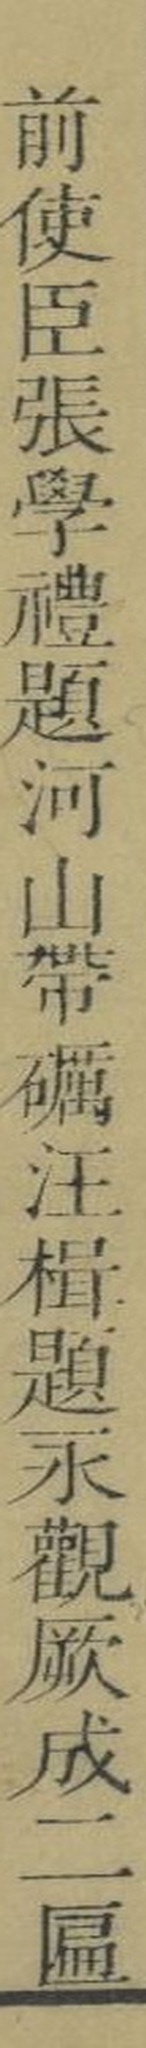前使臣張學禮題河山帶礪汪楫題永觀厥成二匾
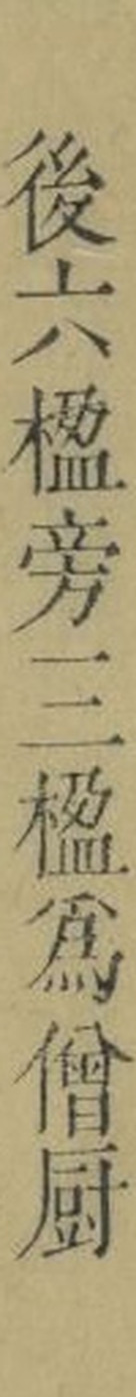後六楹旁三楹爲僧厨
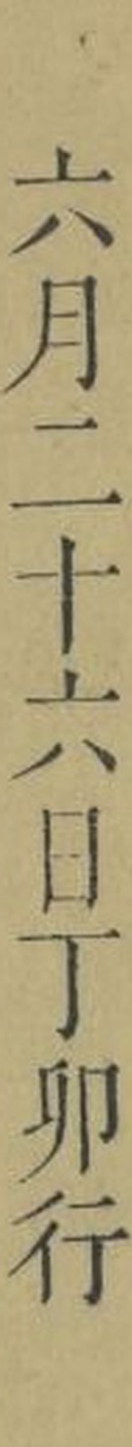六月二十六日丁卯行
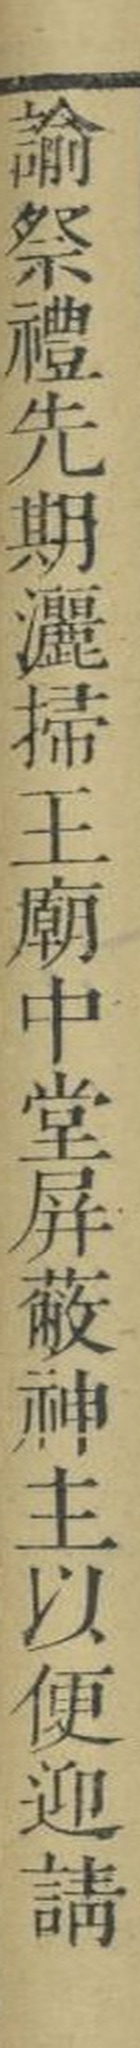諭祭禮先期灑掃王廟中堂屏蔽神主以更迎請
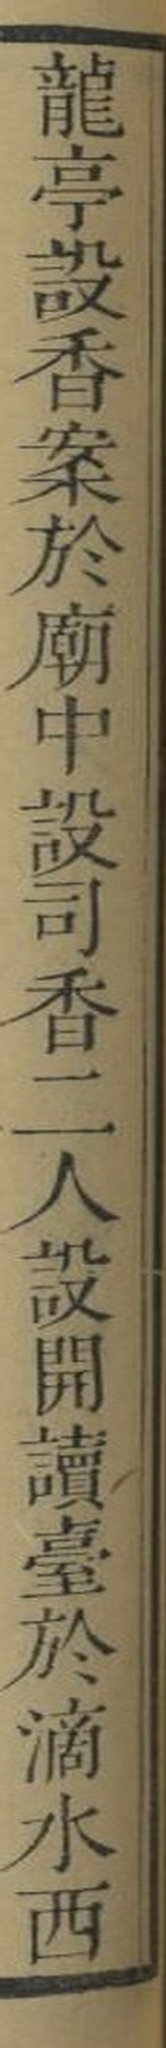龍亭設香案於廟中設司香二人設開讀臺於滴水西
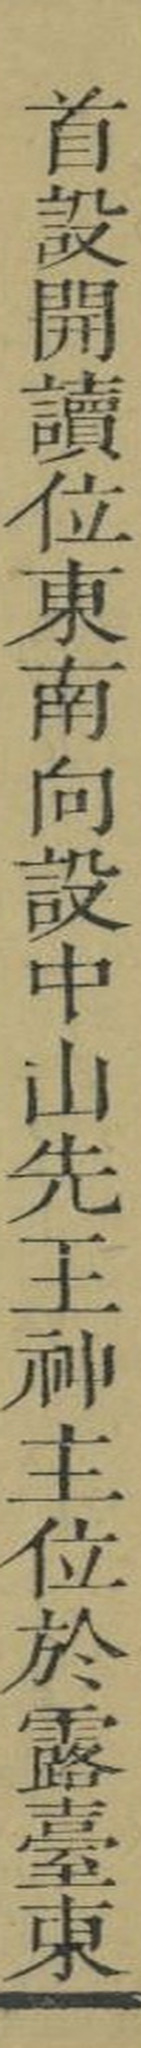首設開讀位東南向設中山先王神主位於露臺東
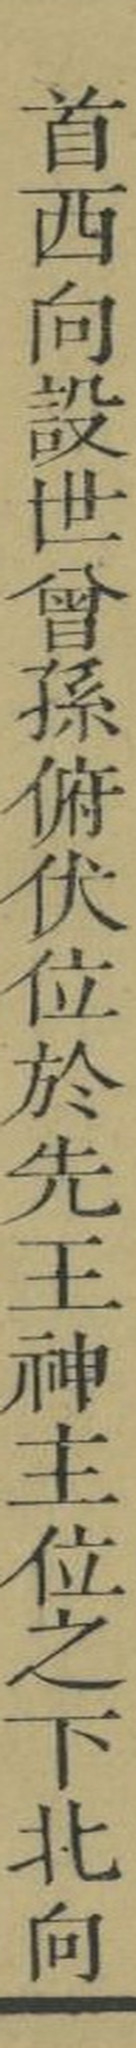首西向設世曾孫俯伏位於先王神主位之下北向
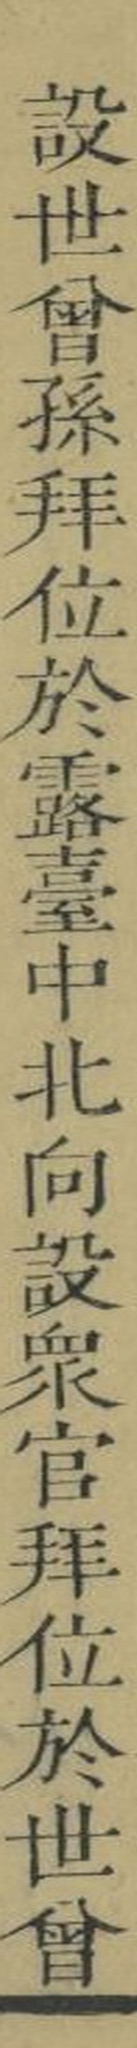設世曾孫拜位於露臺中北向設衆官拜位於世曾
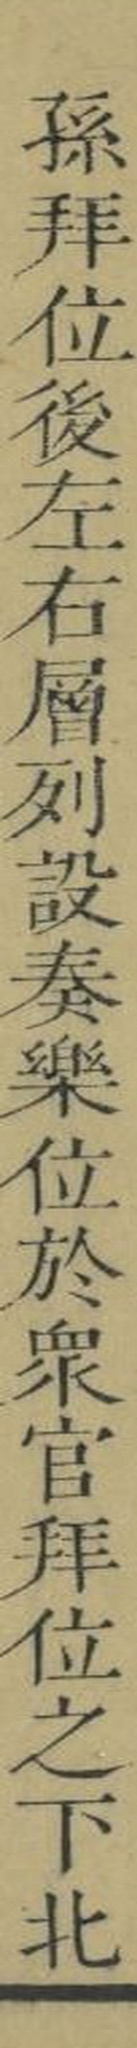孫拜位後左右層列設奏樂位於衆官拜位之下北
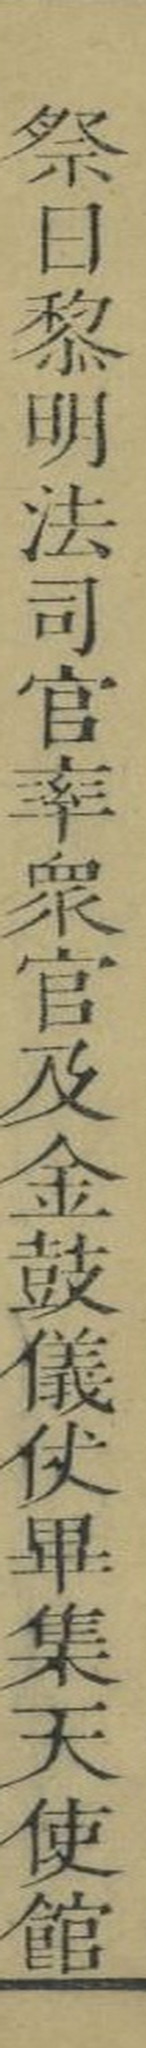祭日黎明法司官率衆官及金鼓儀仗畢集天使館
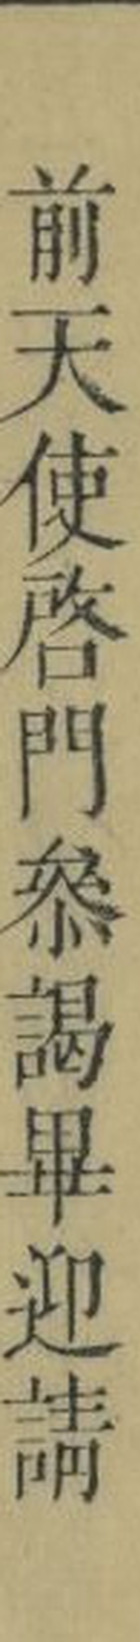前天使啓門叅謁畢迎請
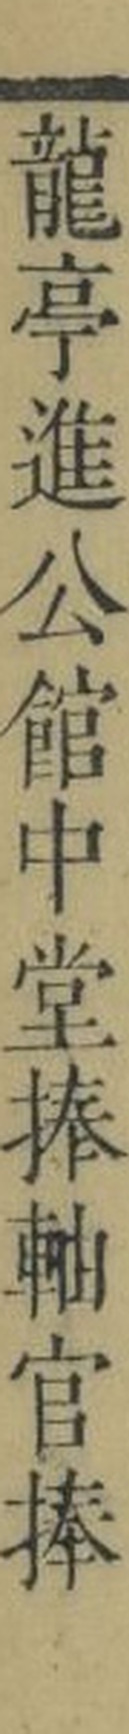龍亭進公館中堂捧軸官捧

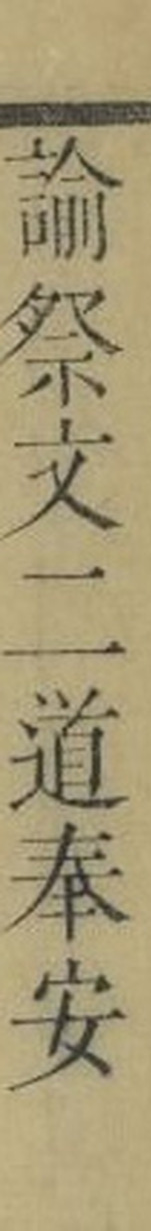諭祭文二道奉安
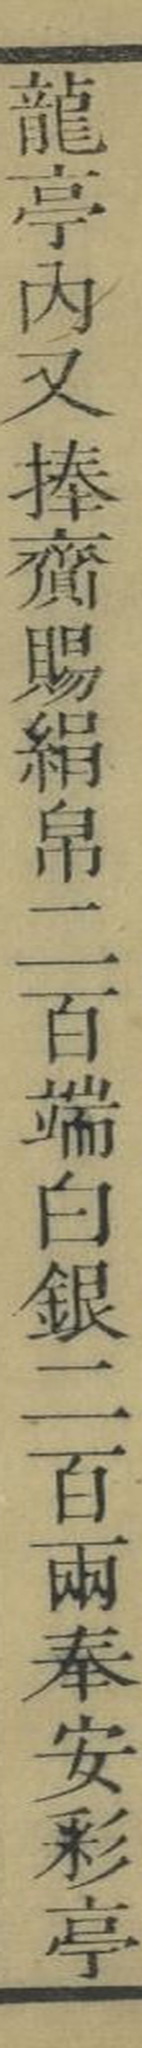龍亭内又捧齎賜絹帛二百端白銀二百兩奉安彩亭
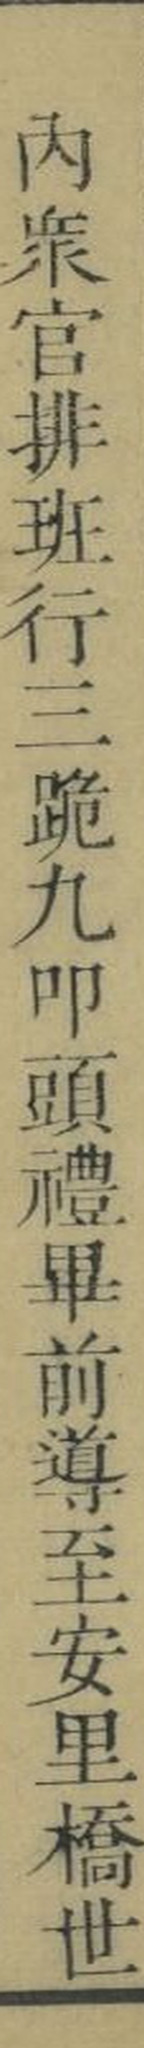内衆官排班行三跪九叩頭禮畢前導至安里橋世
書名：中山伝信録 巻二
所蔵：University of the Ryukyus Library
